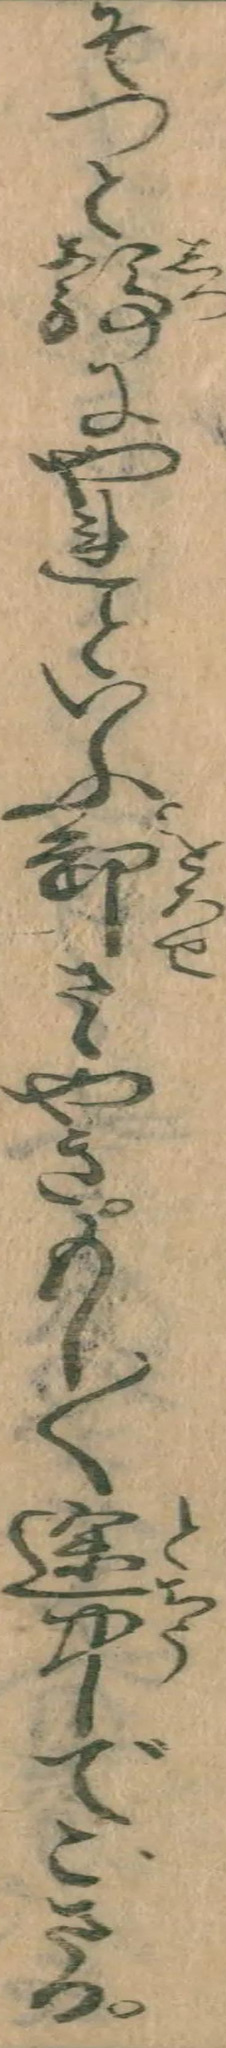そつと静にやれといふ。卸さゝやき。もし〳〵途中でごさる。
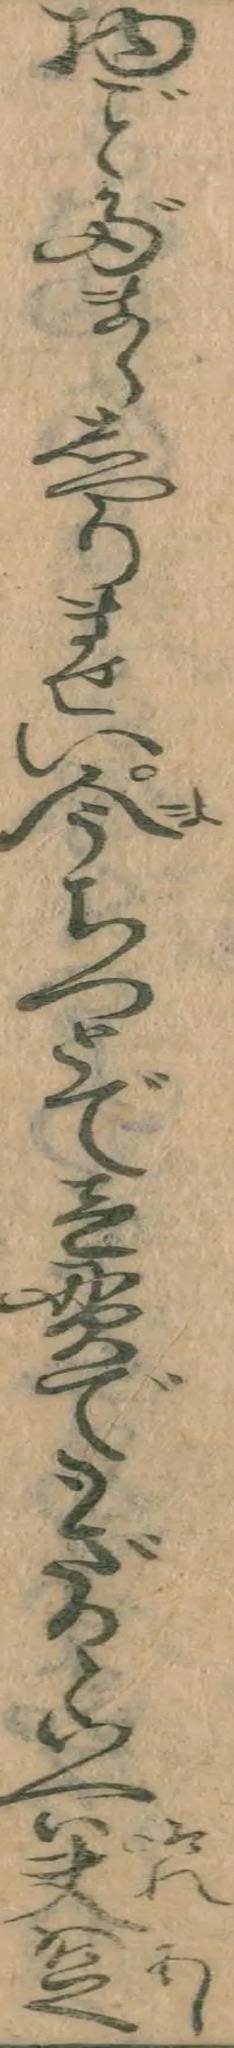物ごとだまらしやりませい。今ちつとで壱貫でこざるといへは。夫は足
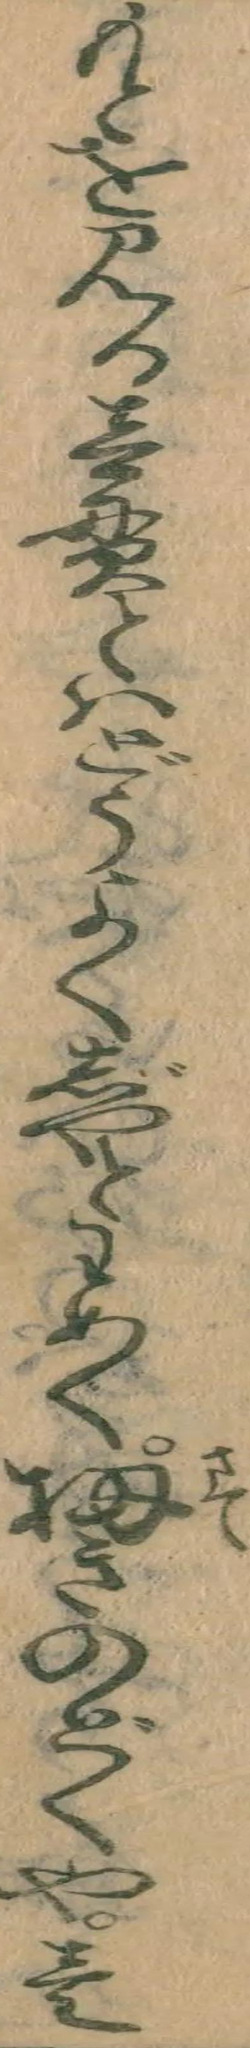もとを見る壱貫とはどうよくじやとわめく。扨きのどくや。壱
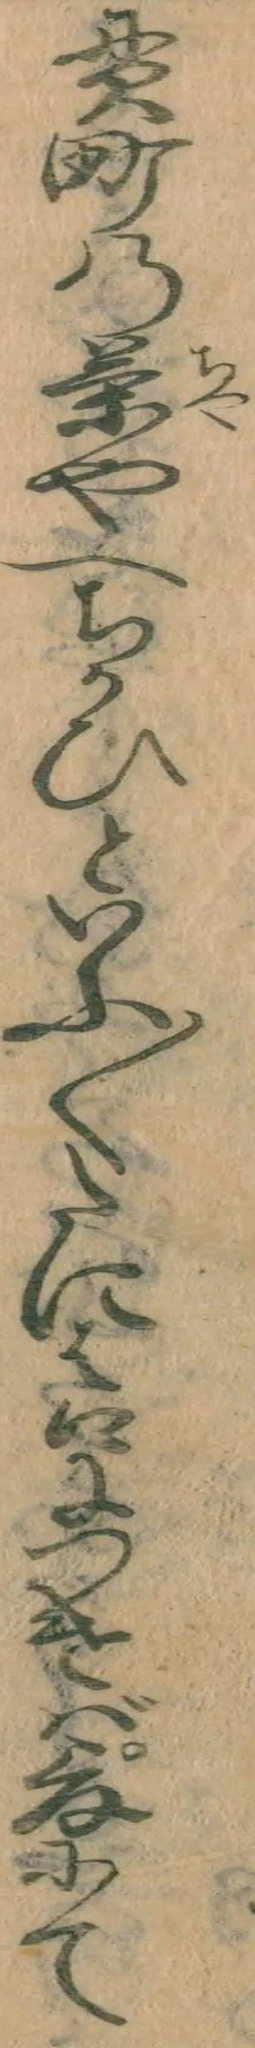貫町の茶やへちかひといふ〳〵たには口につけば。爰にて
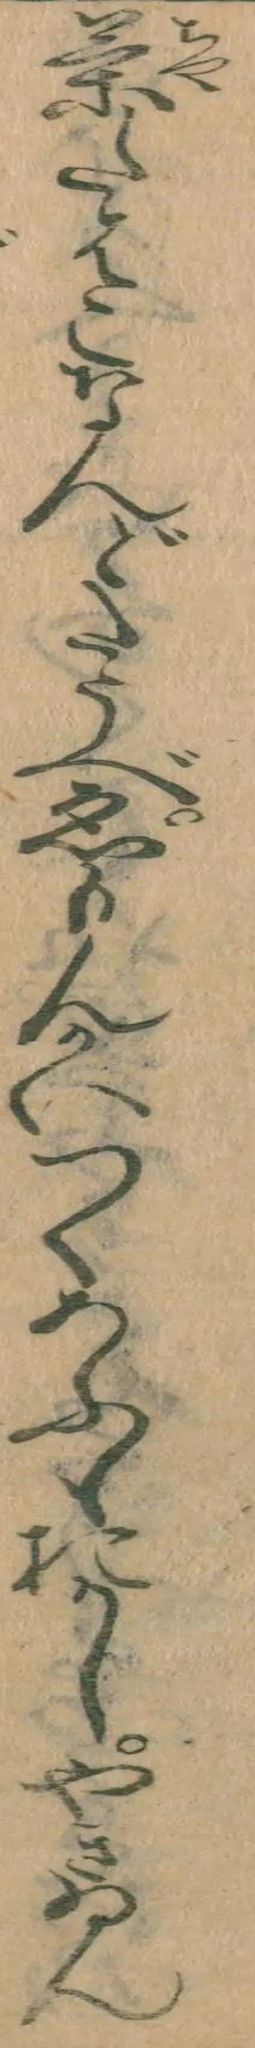茶たはこなんどたうべ。ゑもんかいつくろふもおかし。やきゐん
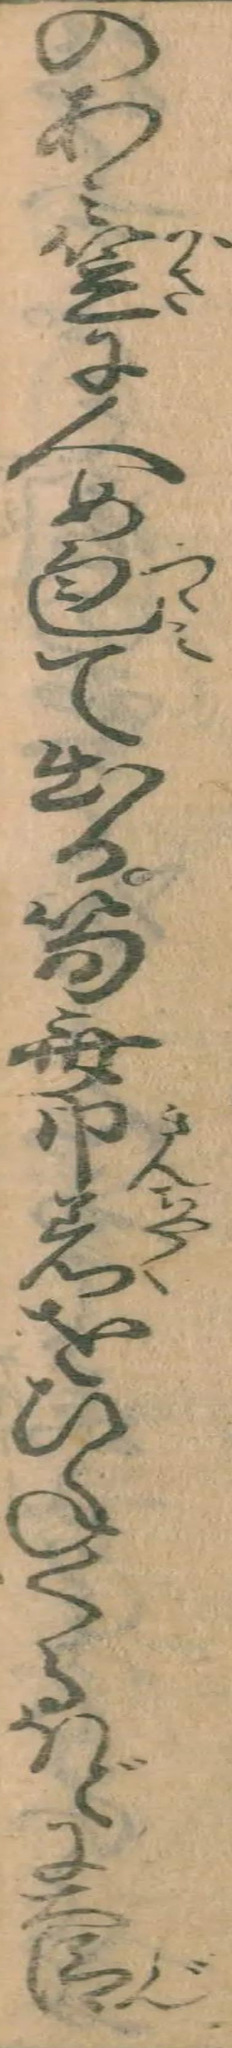のあみ笠に人め包て出る。簡斎巾着をひねくるほどに大臣
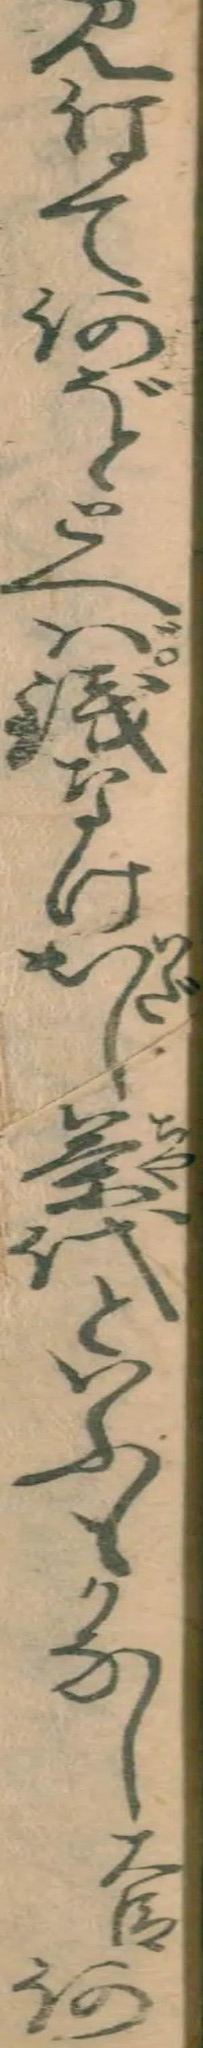見付て何ぞととへば。銭なけ出し茶代といふもかなし大臣何
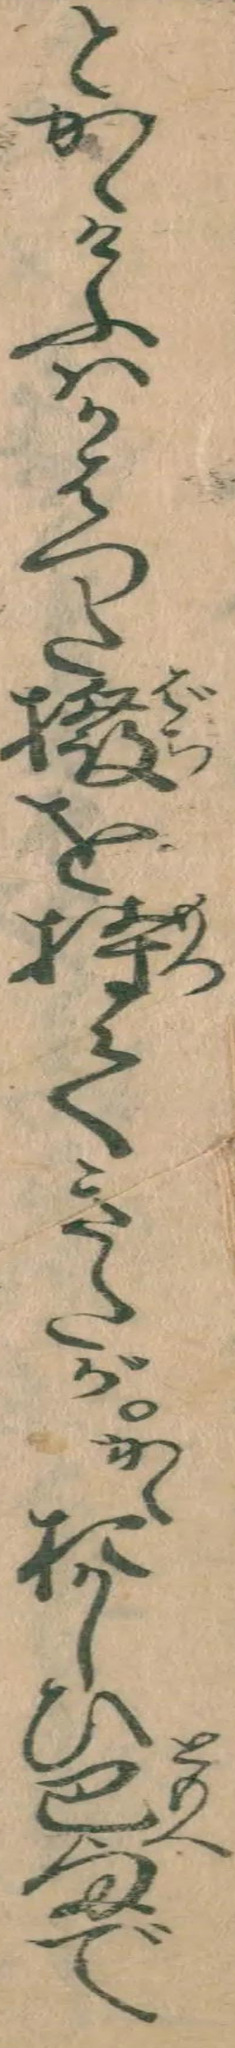とかゝけふはかはつた撥を持てきたが。かかおかしひ巴様で
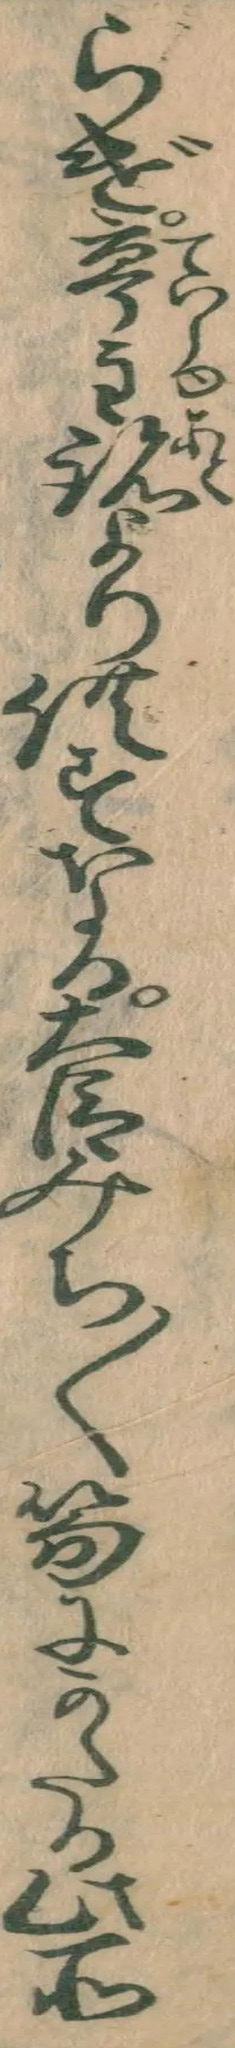らげ。亭主跡より供すなる。大臣みち〳〵筍にかたる此所
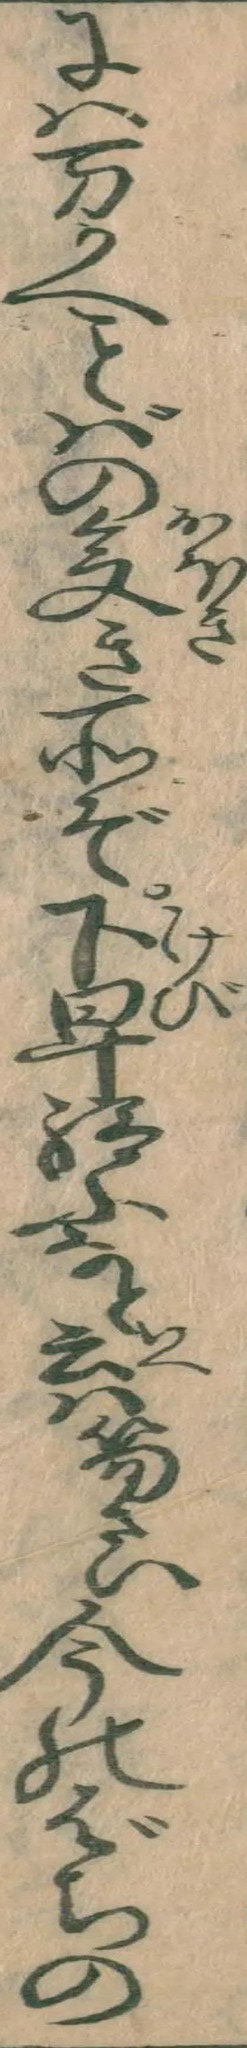には万かへことばの多き所ぞ。下卑給ふなと云は筍さい今のばちの
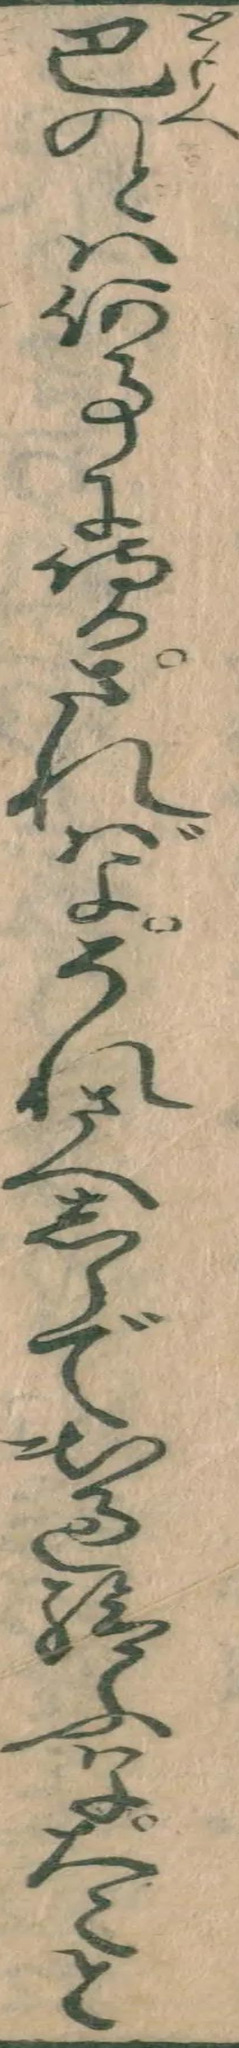巴のとは何事に侍る。さればよ。それさへしらで出過給ふな。大こと
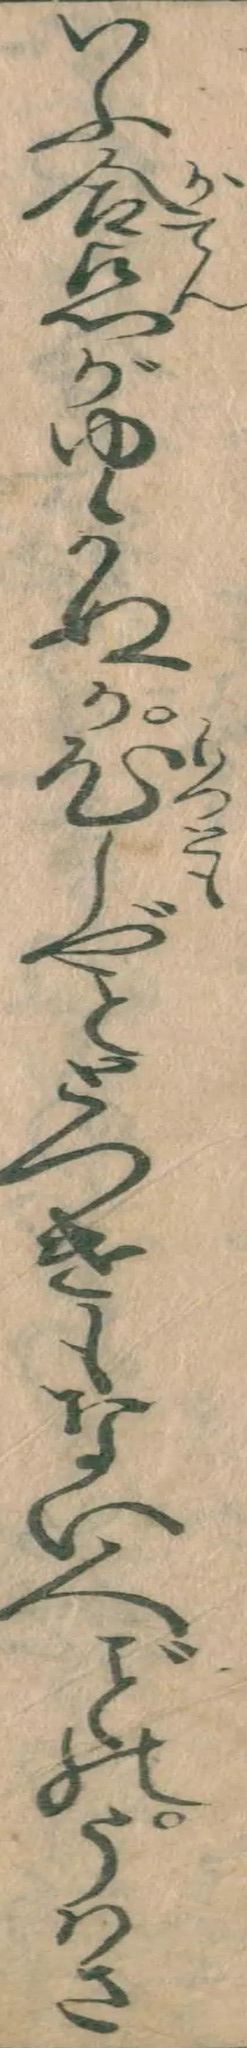いふ合点がゆかぬか。尤じやととつけもない人ごとの。うはさ
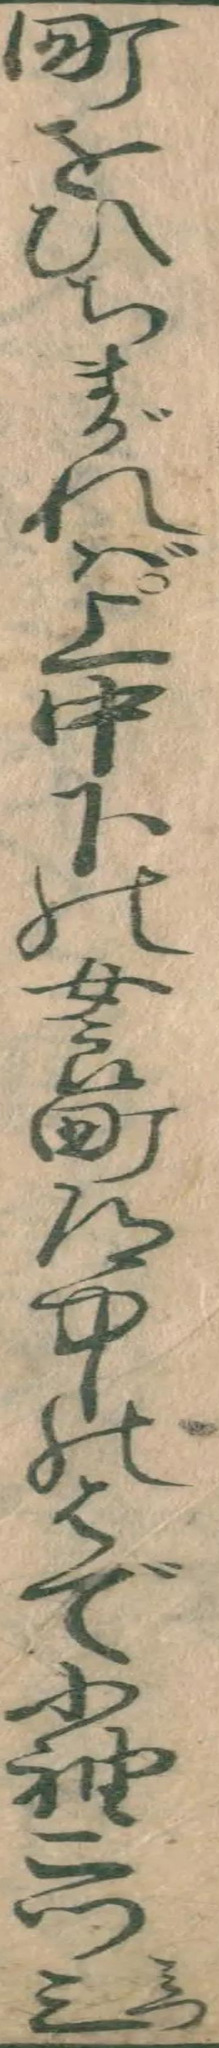町をひちまがれば。上中下の女郎町道中のはで小袖二つ三
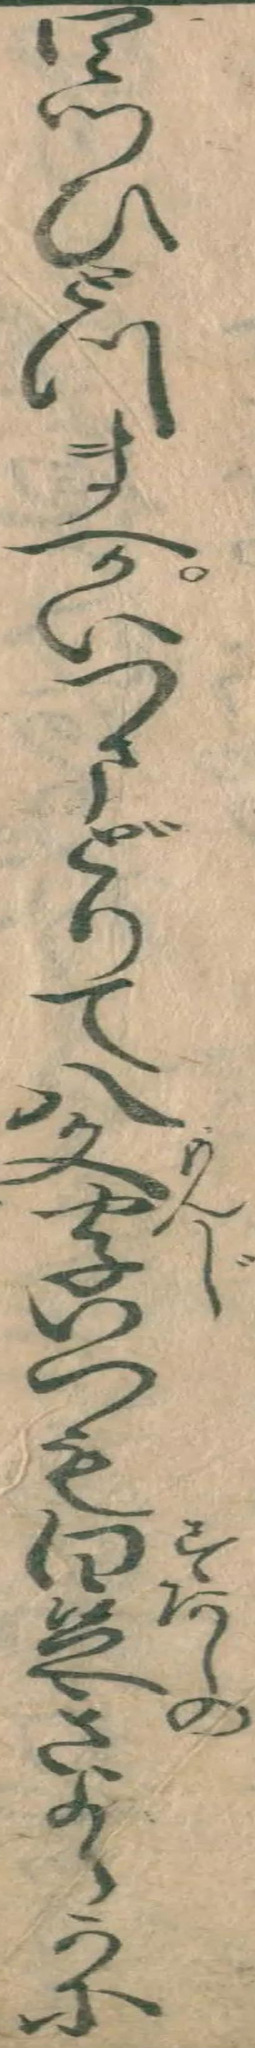四つひとつまへ。かいつまどりて八文字いつも白足のきよらかに
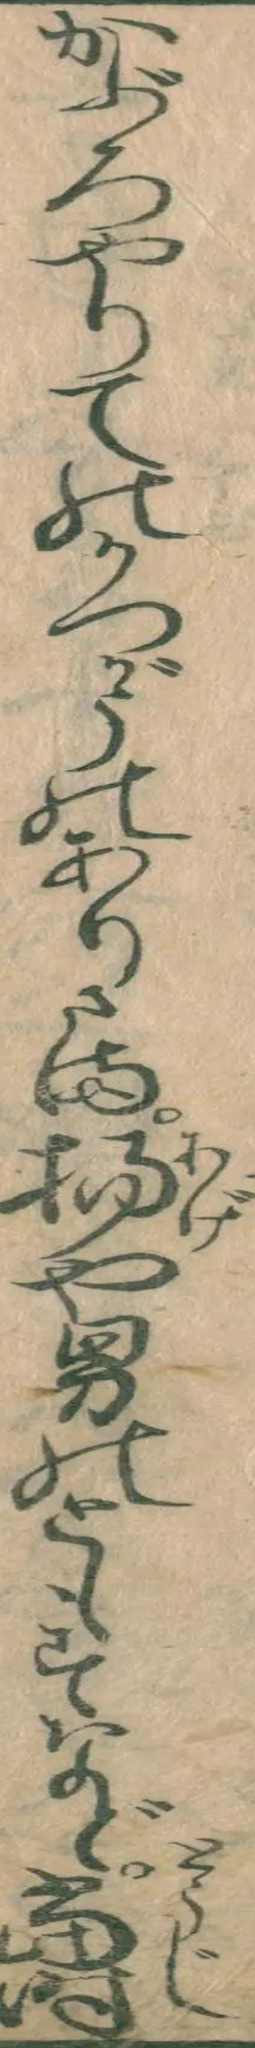かぶろやりてのかつがうのありさま。揚や男のともすなど。当時
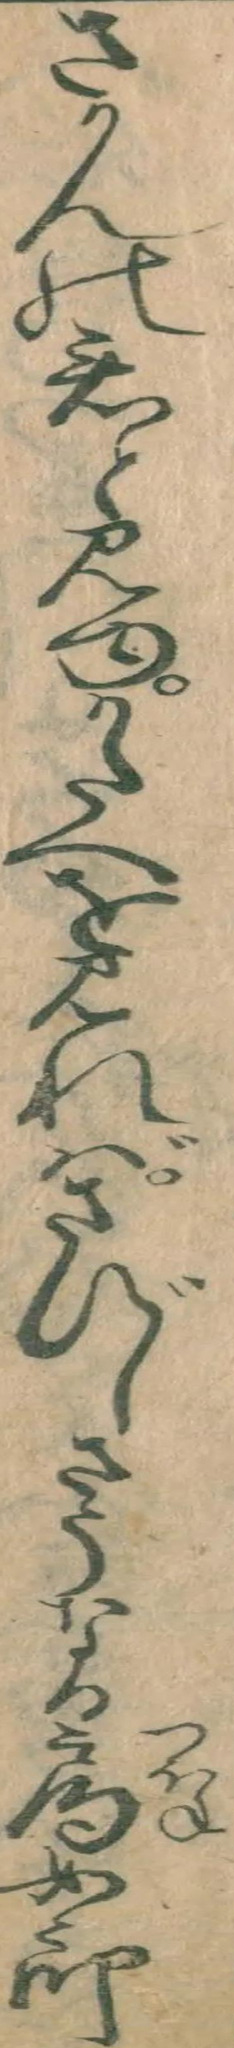さかんの君と見ゆ。かたへを見れば。さびしさうなる局女郎
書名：新竹斎 5巻
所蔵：国立国会図書館 National Diet Library, JAPAN
